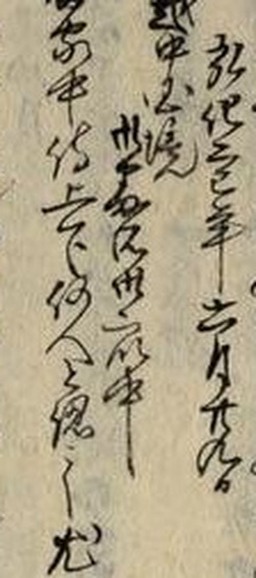御番所御衆中
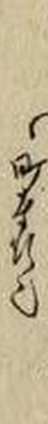町奉行也
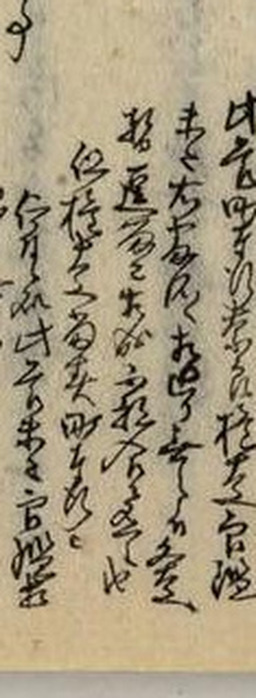暫逗留ニ相成不程合ニ有之由
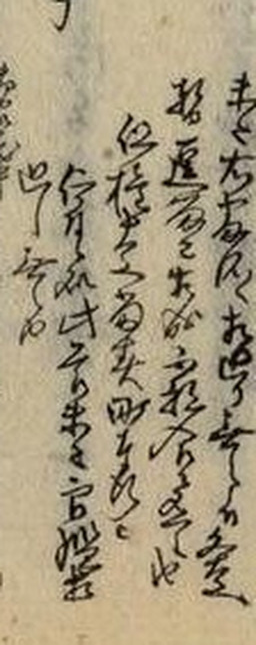但権太夫当春町奉行被
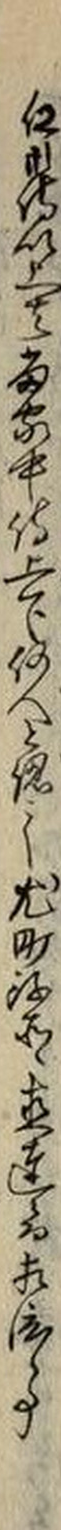但御侍以上者当家中侍上下何人と認之尤町役所へ直達ニ而相渡候事
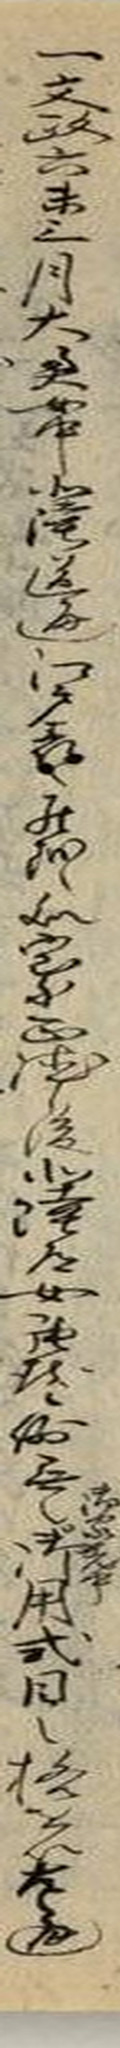一文政六未三月大奥女中北陸道通江戸表へ罷越候処宝永正徳之後北陸道女罷越候儀無之御家老中御用式目之格を以左之通
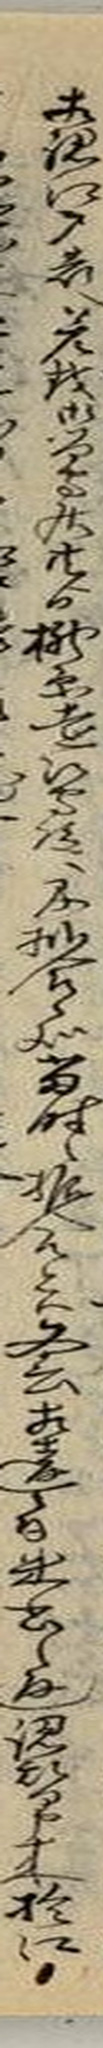相認江戸表へ差越御留守居共ゟ榊原遠江守殿へ及掛合候処当時之振合とハ文言相違ニ付朱書之通認替申来於江
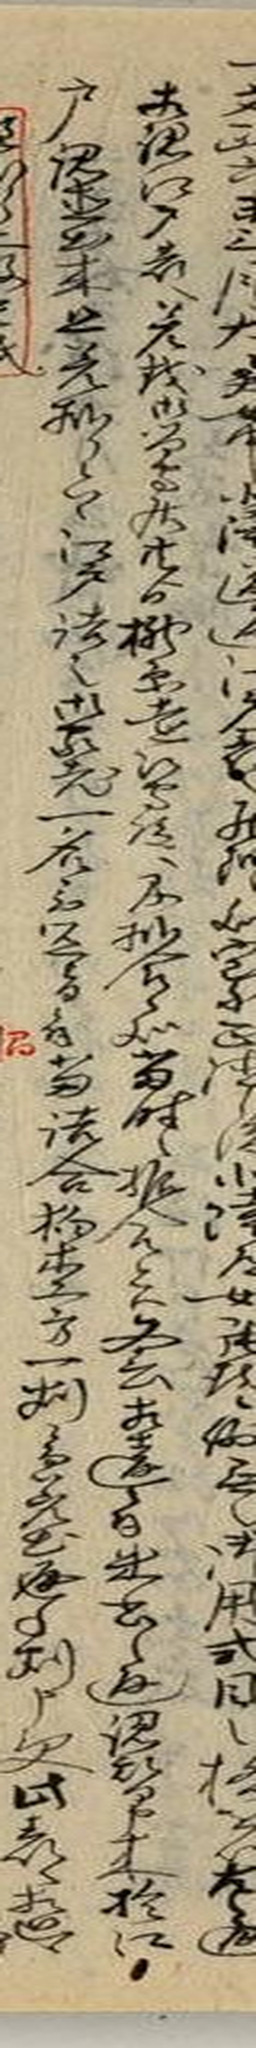戸認直出来且差掛り候ハヽ江戸詰之御家老一名ニ而宜旨ニ付当詰合狛木工方一判ニ而差出通手形申受此表へ相廻候事
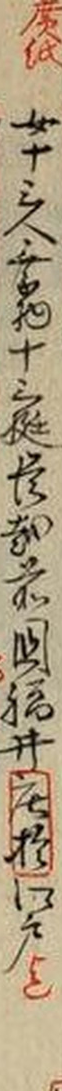女十三人乗物十三挺従越前国福井庄於江戸迄
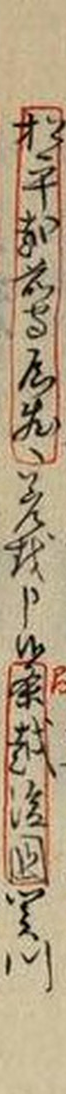松平越前守屋敷へ差越申候条越後国関川
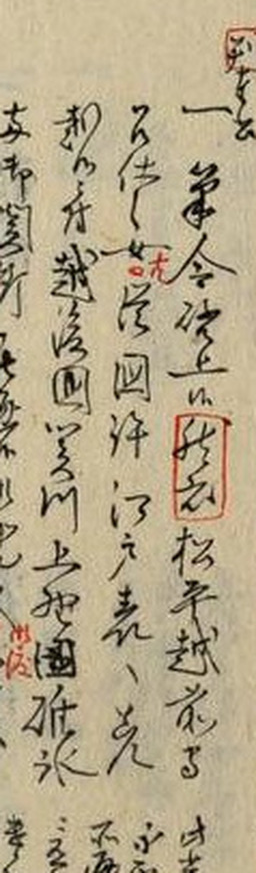召仕候女共従国許江戸表へ差
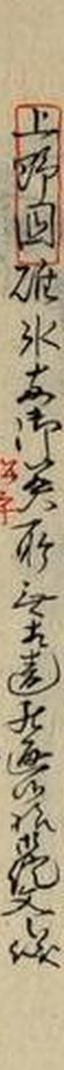上野国碓氷両御関所無相違罷通候様御証文之儀
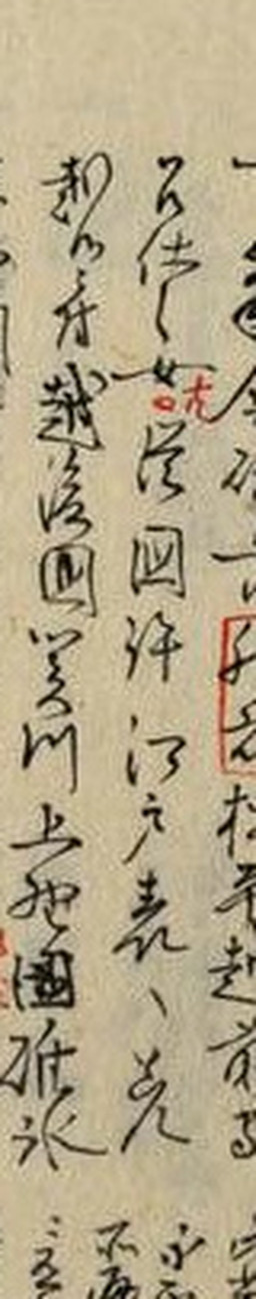越候ニ付越後国関川上野国碓氷
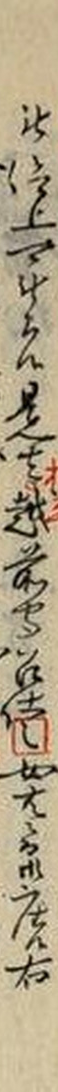被仰上可被下候是者松平越前守召仕之女共ニ而御座候右
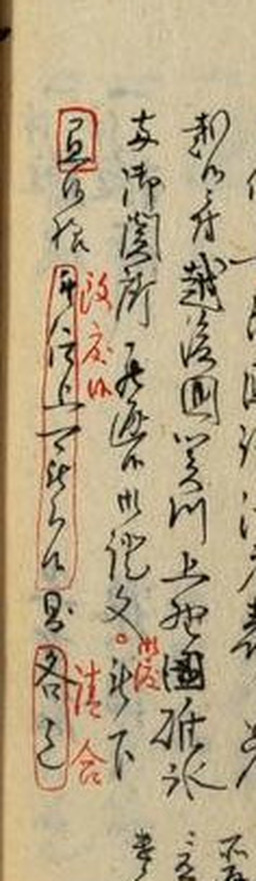両御関所罷通候御証文御渡被下
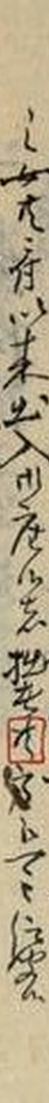之女共ニ付以来出入御座候者拙者共方江可被仰聞候
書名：御国他国諸事之部
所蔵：福井県文書館 Fukui Prefectural Archives
